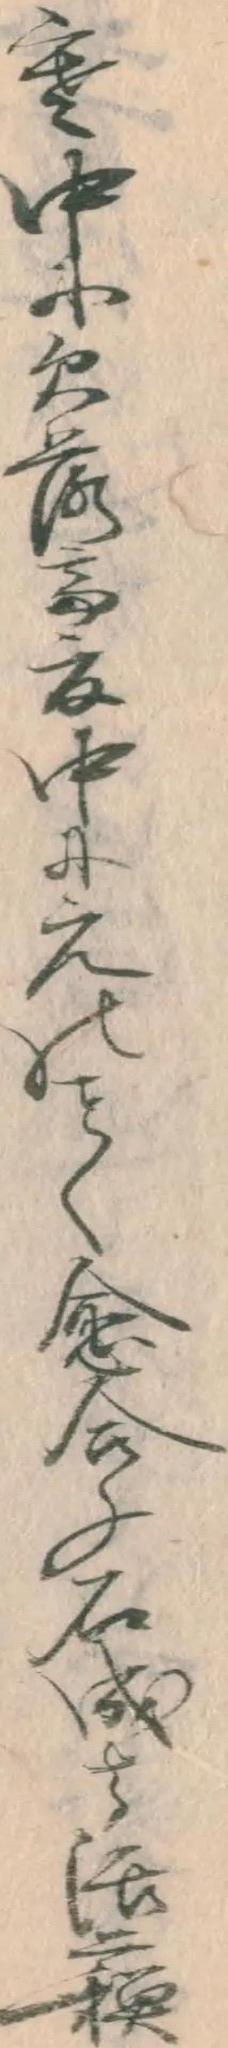寒中に欠落て夏中に元のことく愈合ふ石成は活蘇
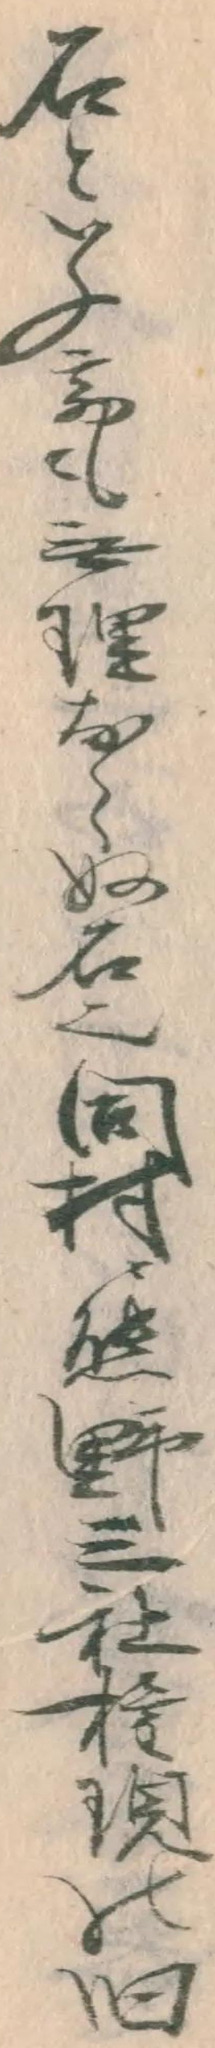石といふても無理ならぬ石也同村に熊野三社権現の旧
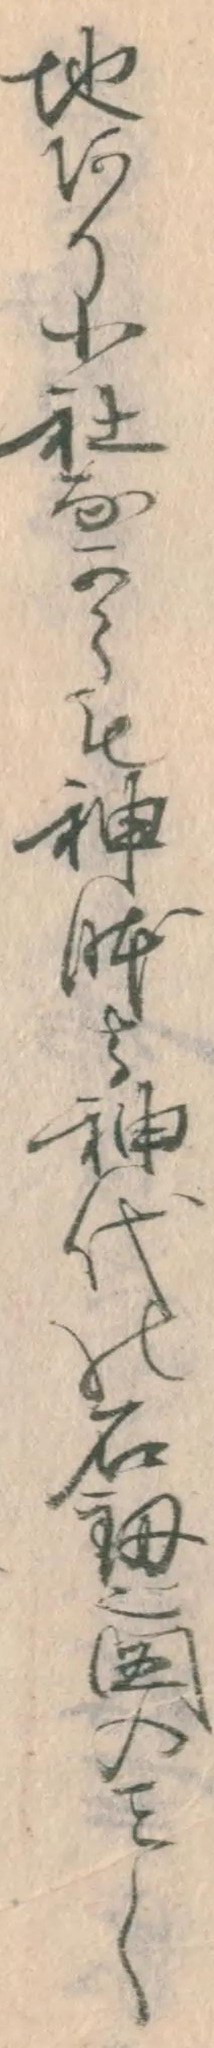地あり小社なからも神体は神代の石剣也図のことし
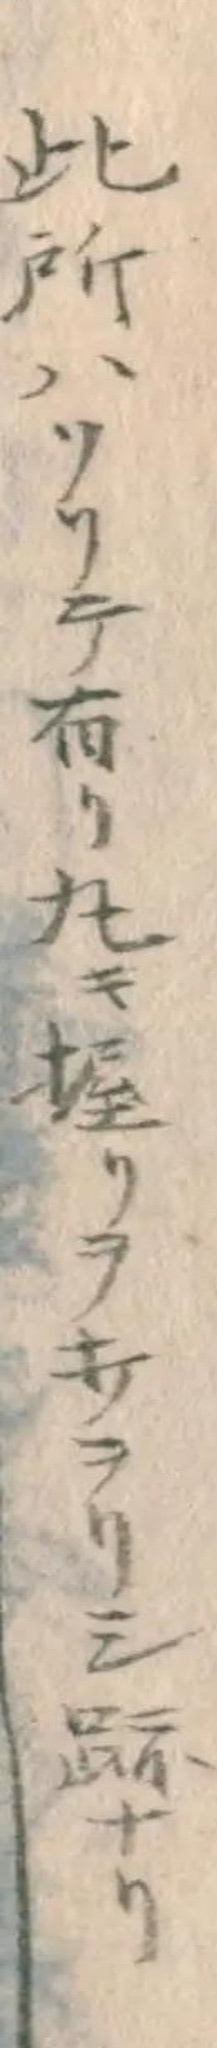此所ハソリテ有リ丸キ握リヲ打ヲリシ跡ナリ
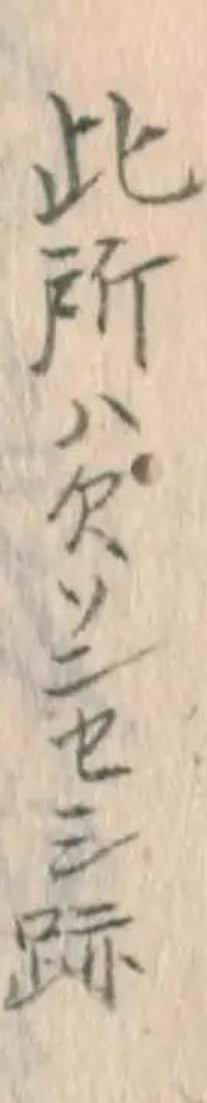此所ハ欠ソンセシ跡
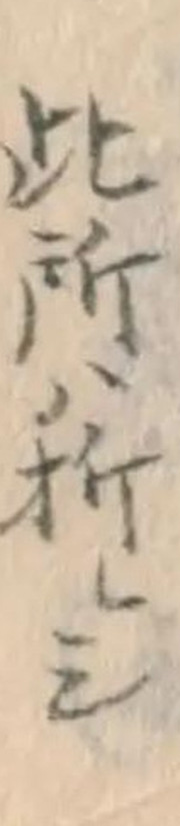此所ハ折レシ
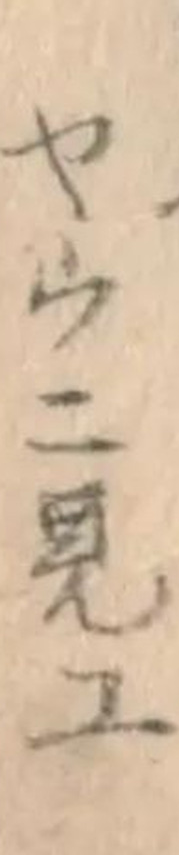ヤウニ見ユ

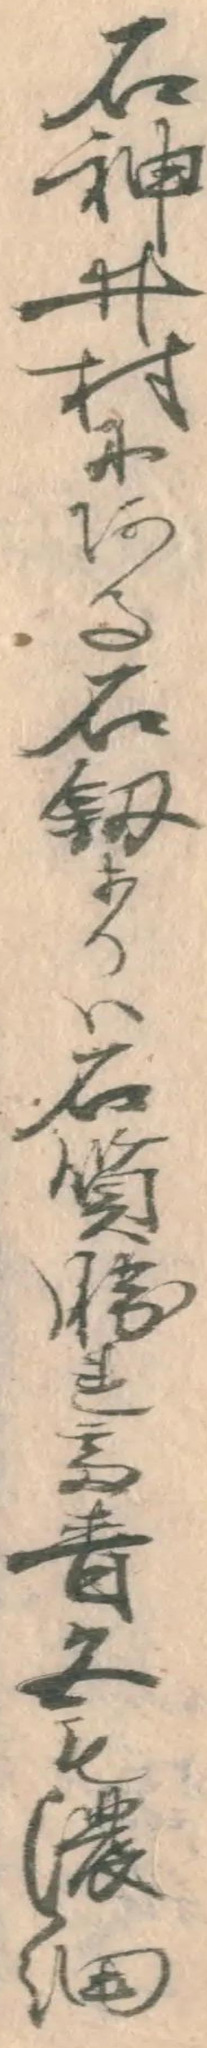石神井村にある石剣よりは石質勝れて青色も濃細
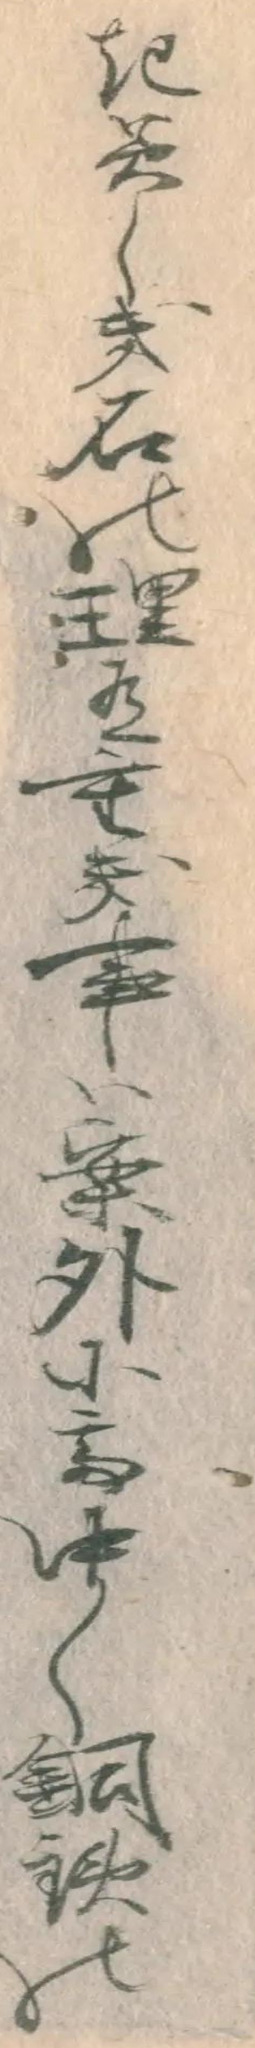き美しき石の理有重き事は案外にて中〳〵銅鉄の
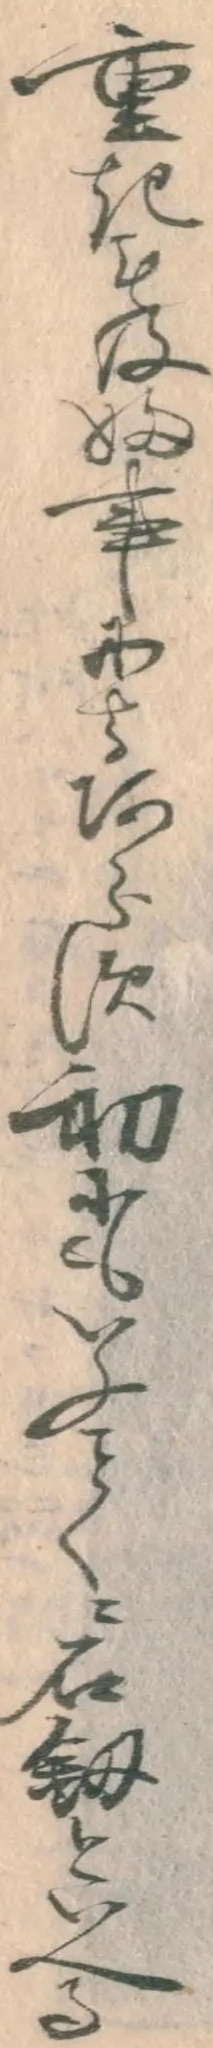重きも及ふ事にはあらす初にもいふことくに石剣といへる
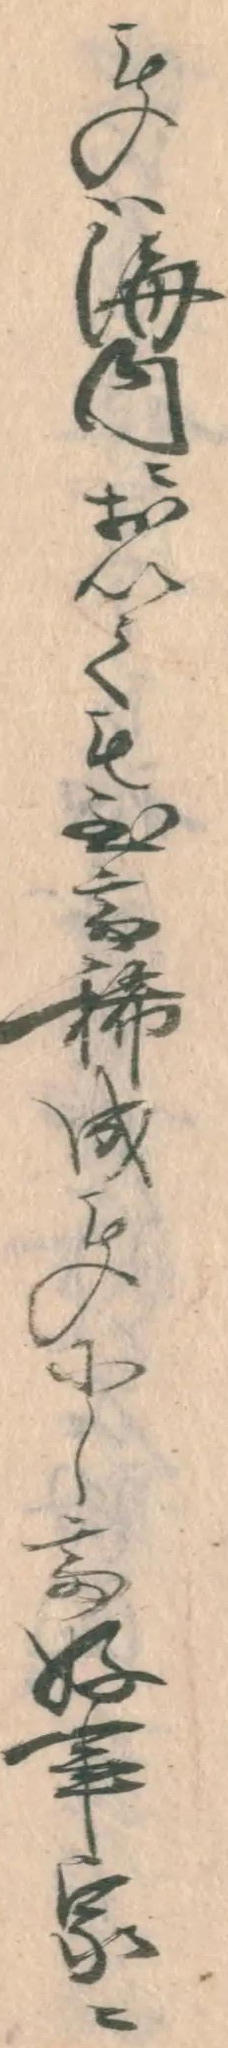ものは海内においても至て稀成ものにし好事家に
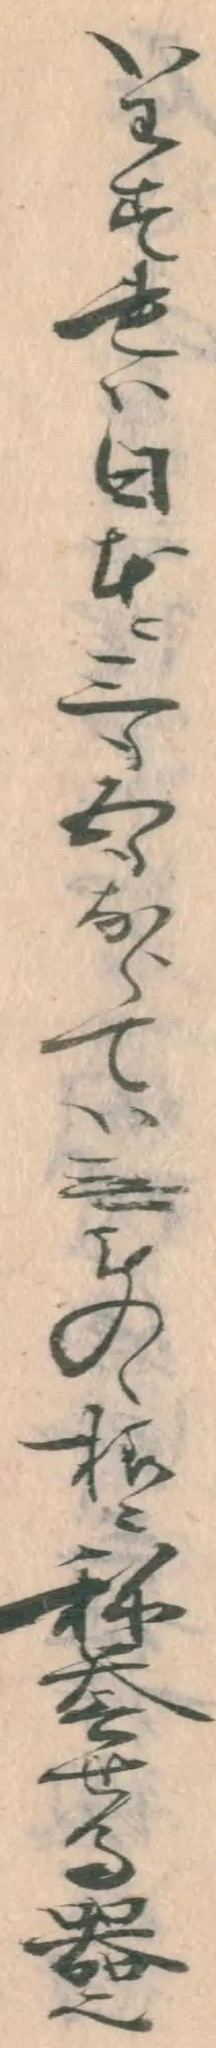いわすれは日本に三つ五つならては無ものゝ様に称誉せる器也
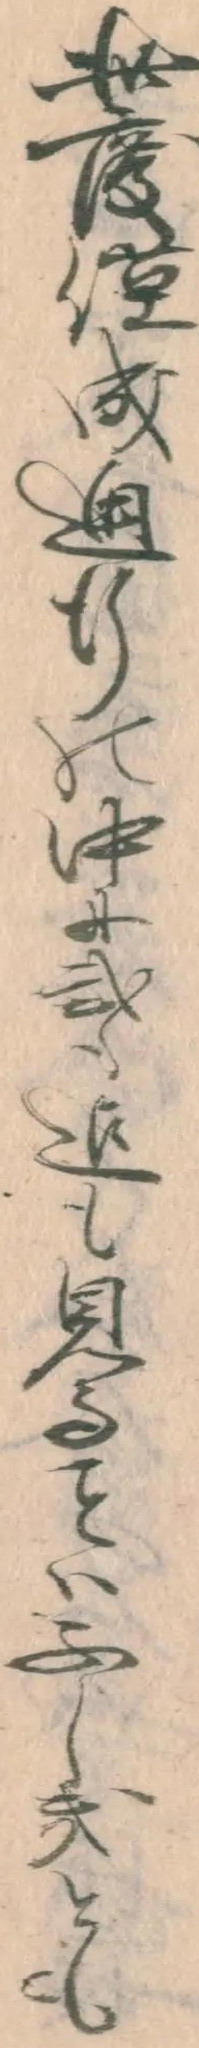此度僅成通行の中に弐つ迄も見ることはふしきとも
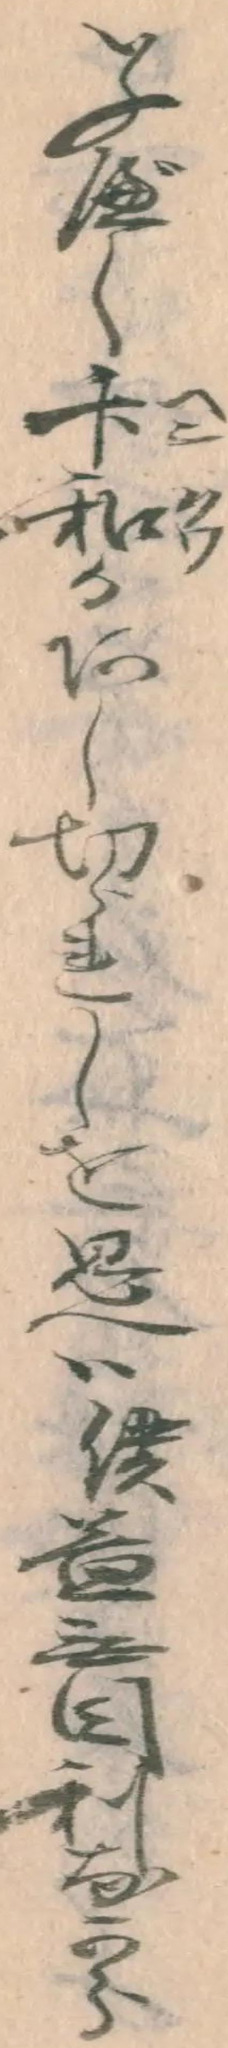ふべし卞和かあし切られしを思へは僕益無目利なから
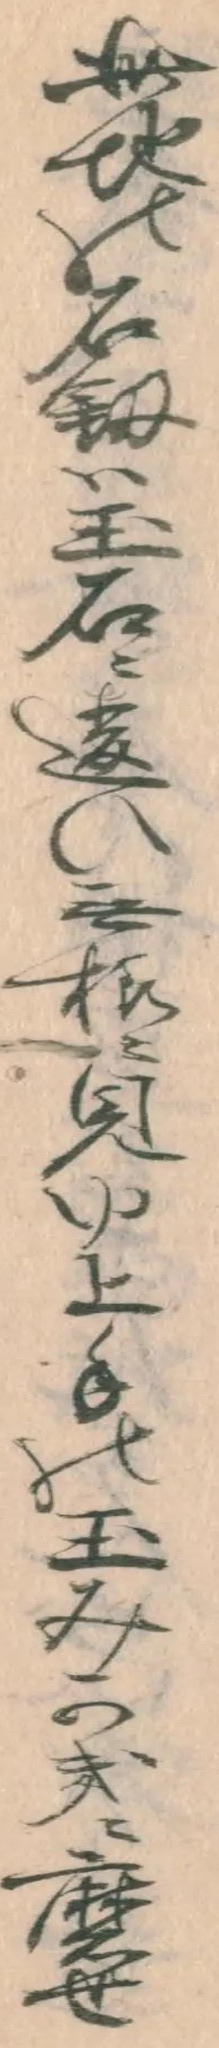此地の石剣は玉石に違ひ無様に見ゆ上手の玉みかきに磨せ
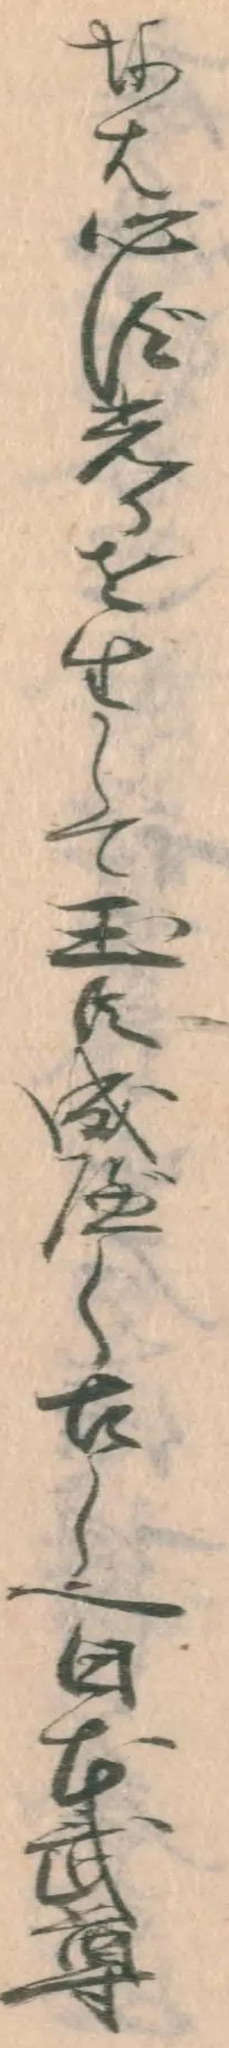なは必ず光りを生して玉共成べし古しへ日本武尊
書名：四神地名録 6巻. [4]葛飾郡
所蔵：国立国会図書館 National Diet Library, JAPAN
